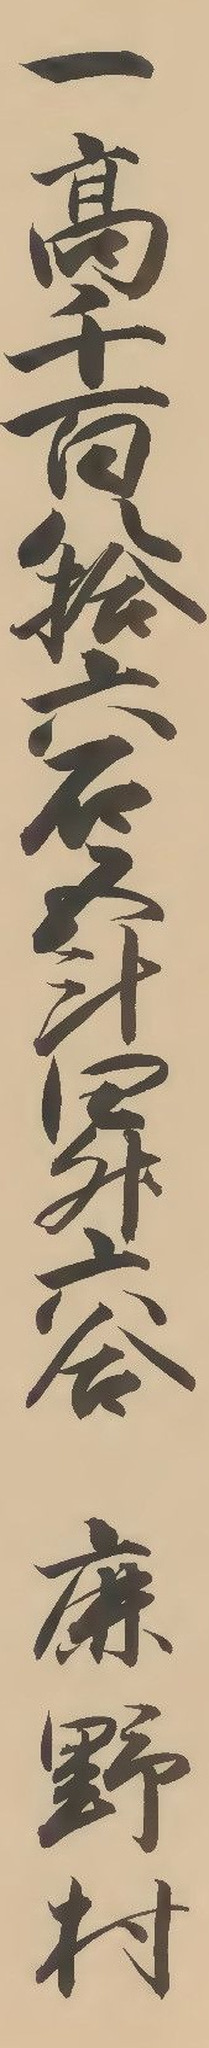一高千百八拾六石五斗四升六合鹿野村
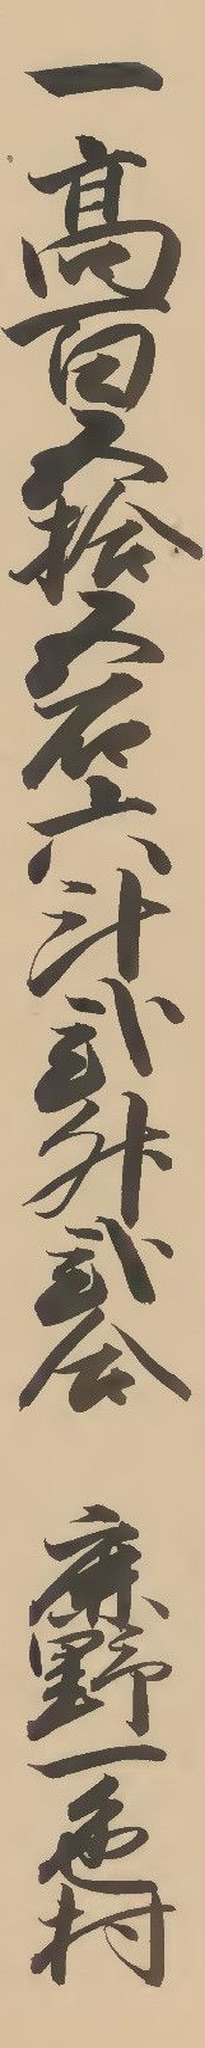一高百五拾五石六斗弐升弐合鹿野一色村
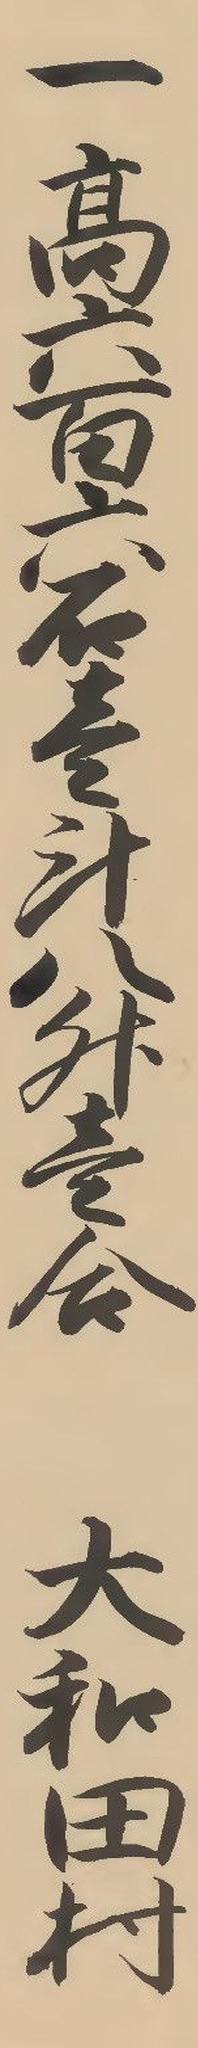一高六百六石壱斗八升壱合大和田村
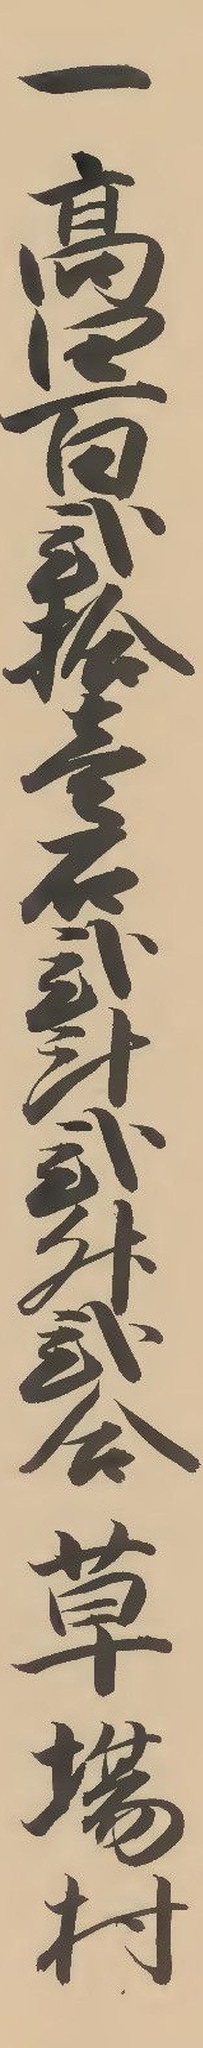一高四百弐拾壱石弐斗弐升弐合草場村
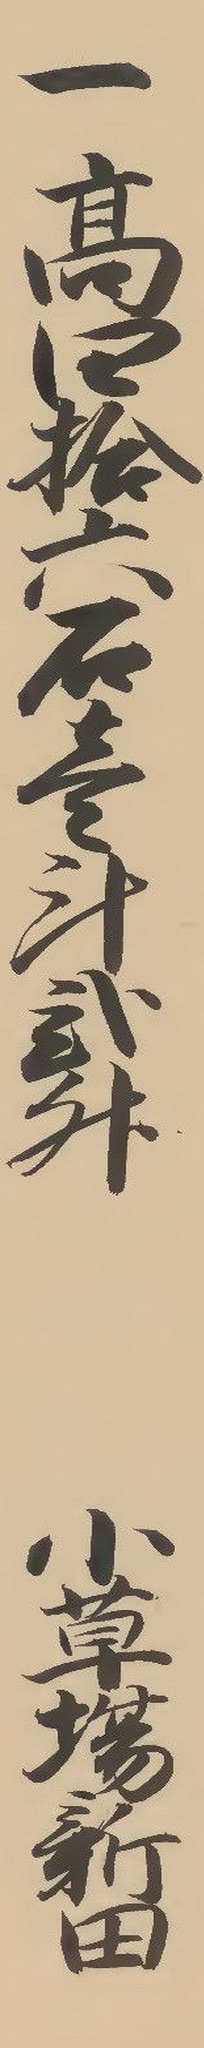一高四拾六石壱斗弐升小草場新田
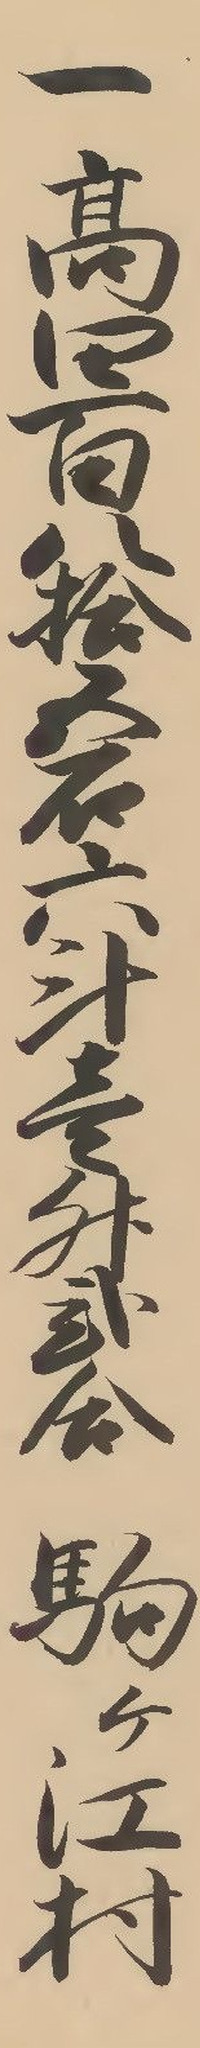一高四百八拾五石六斗壱升弐合駒ヶ江村

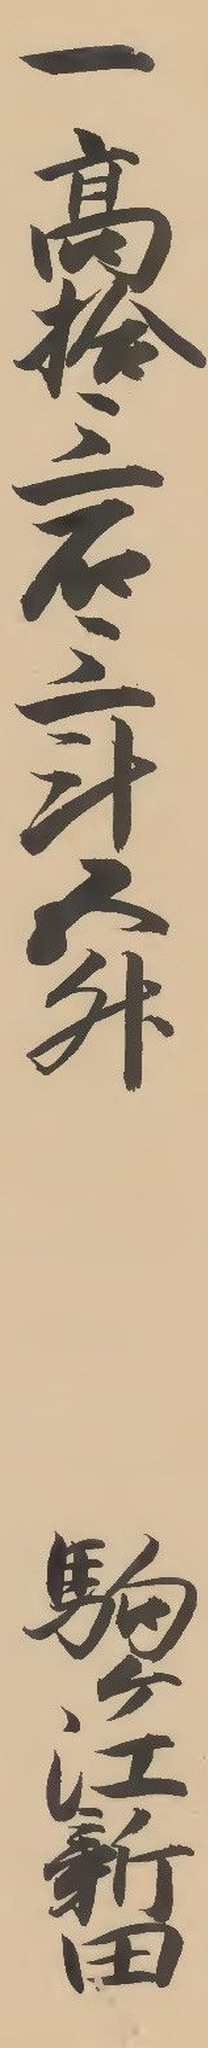一高拾三石三斗五升駒ヶ江新田
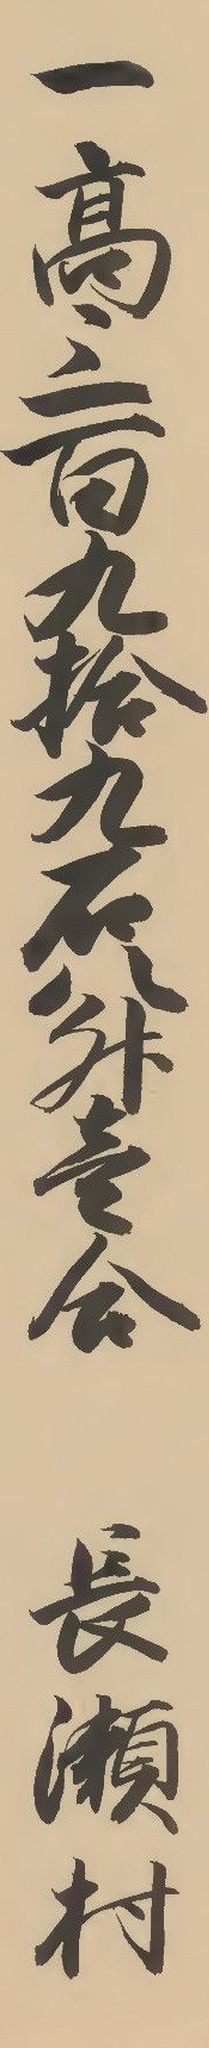一高三百九拾九石八升壱合長瀬村
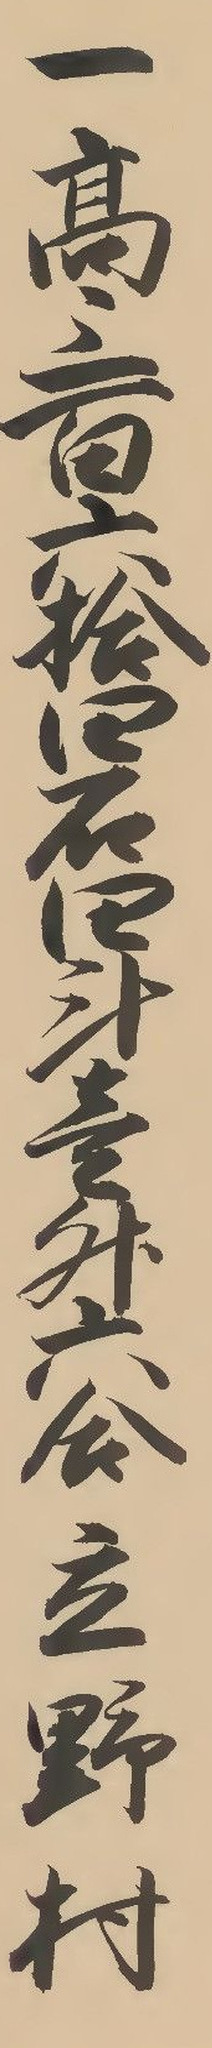一高三百六拾四石四斗壱升六合立野村
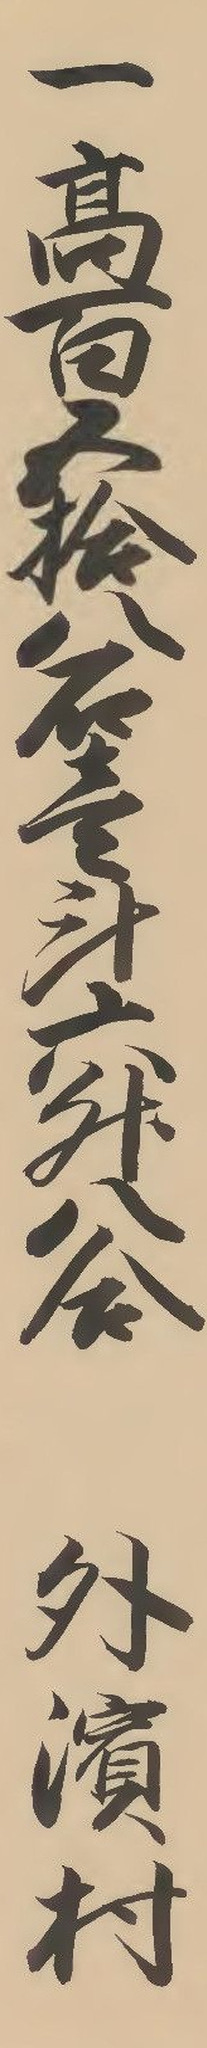一高百五拾八石壱斗六升八合外浜村
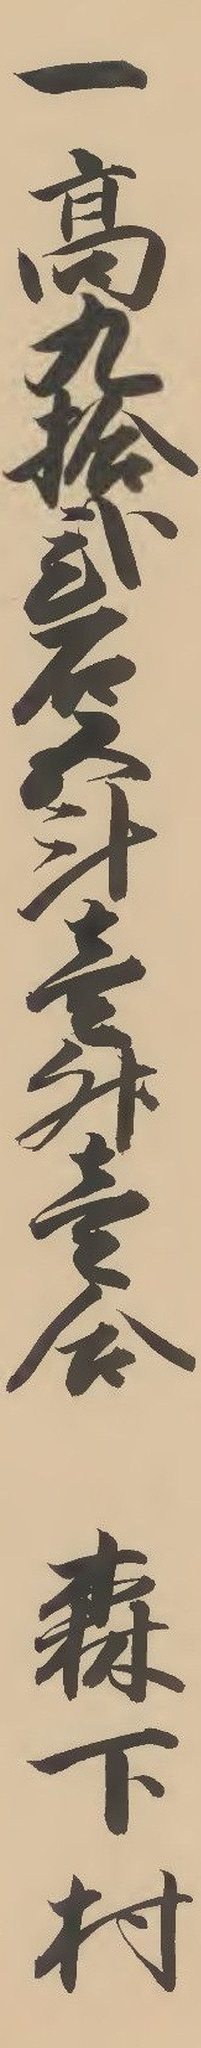一高九拾弐石五斗壱升壱合森下村
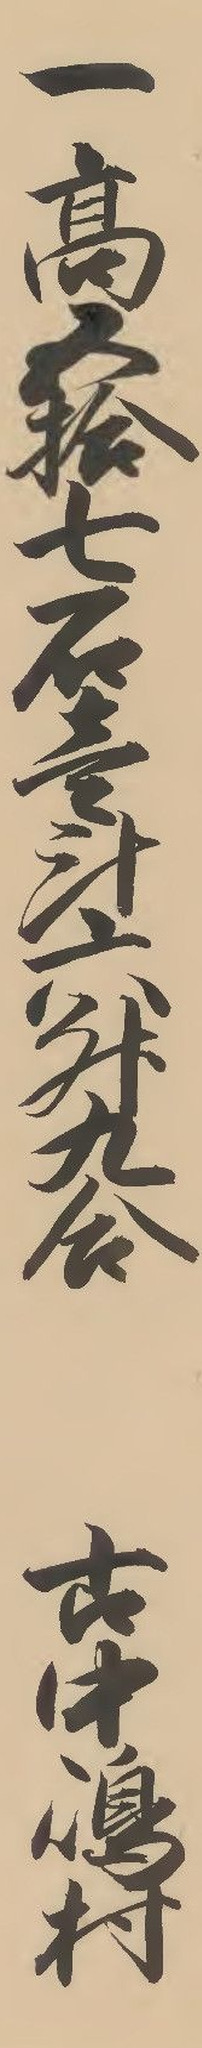一高五拾七石壱斗六升九合古中島村
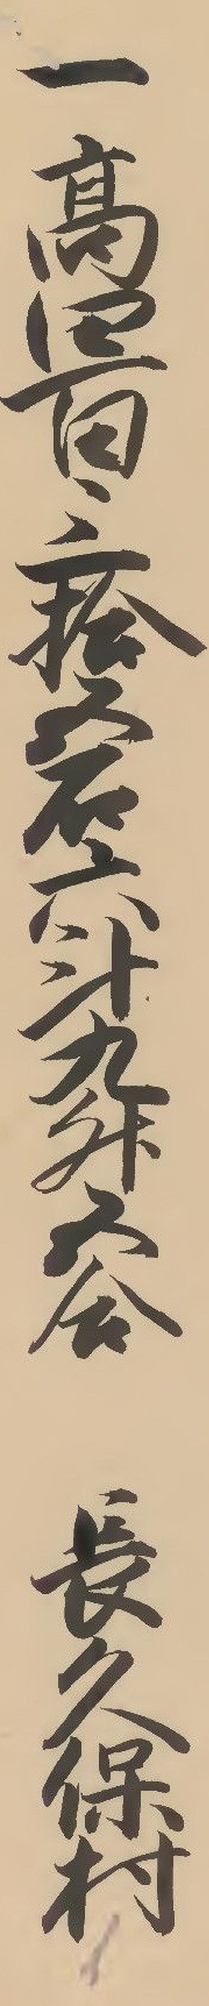一高四百三拾五石六斗九升五合長久保村

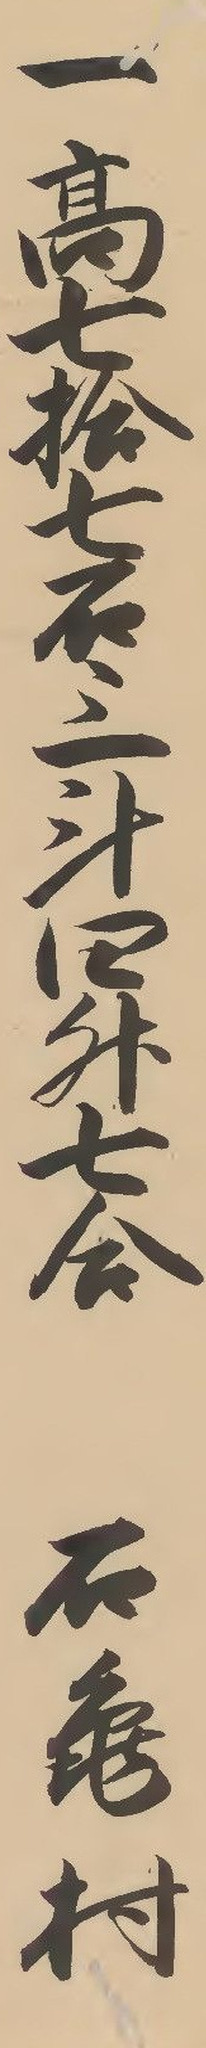一高七拾七石三斗四升七合石亀村
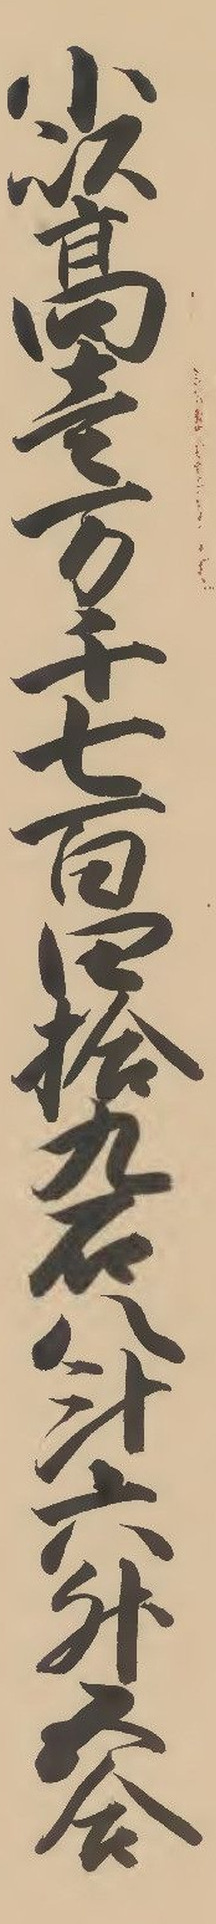小以高壱万千七百四拾九石八斗六升五合
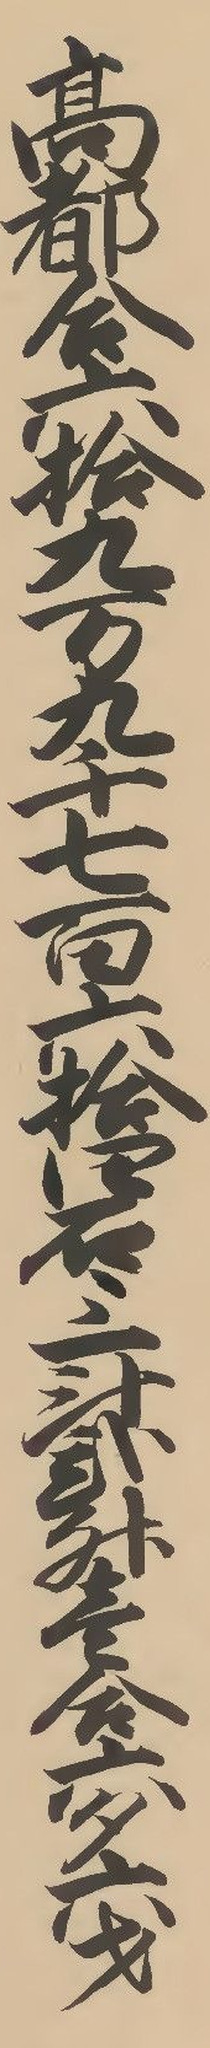高都合六拾九万九千七百六拾四石三斗弐升壱合六勺六才
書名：美濃国郷帳
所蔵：国立公文書館 National Archives of Japan
